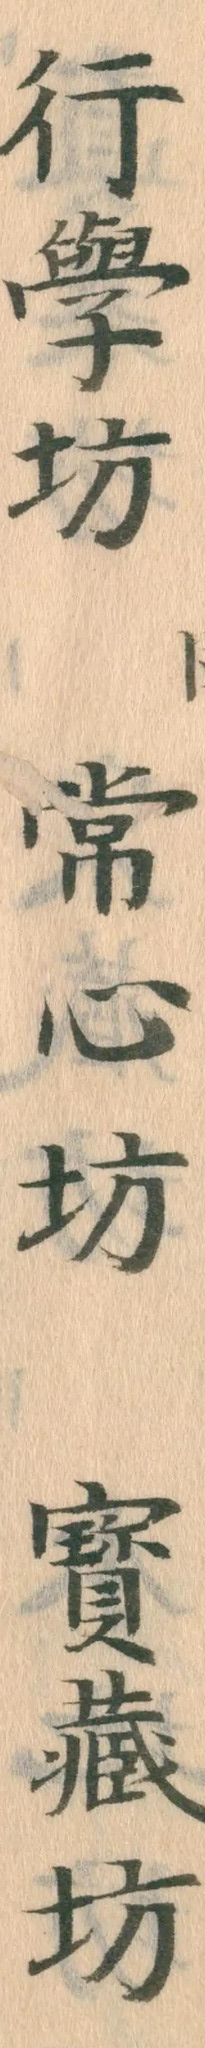行学坊常心坊寶蔵坊
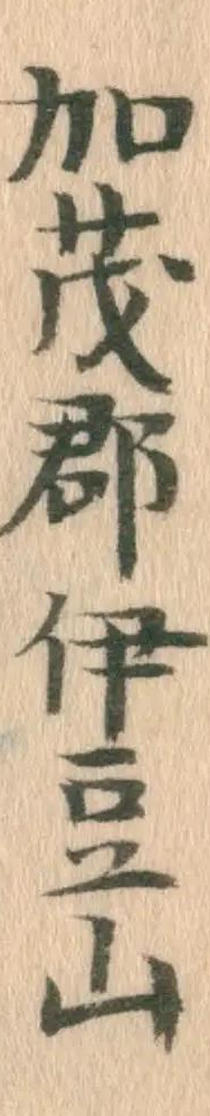賀茂郡伊豆山
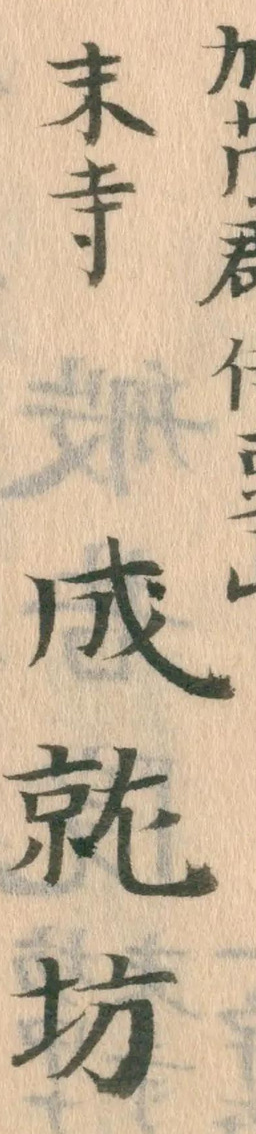未寺成就坊
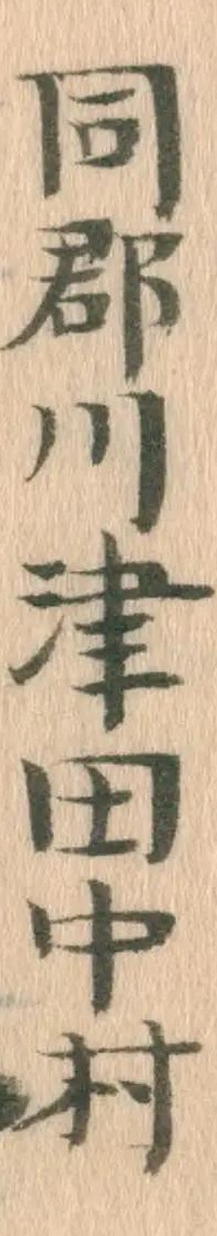同郡川津田中村
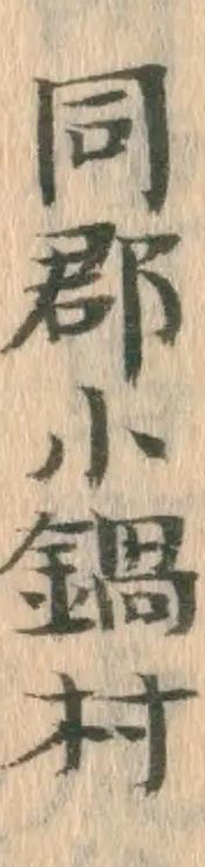同郡小鍋村
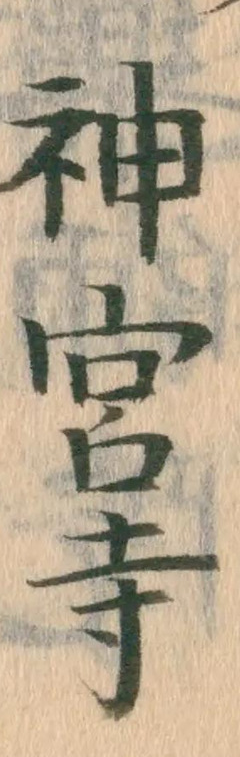神宮寺
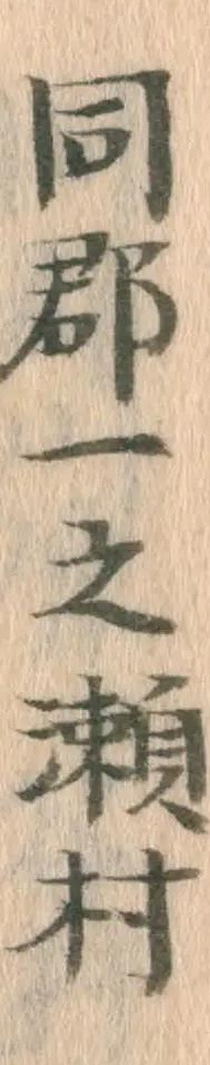同郡一之瀬村
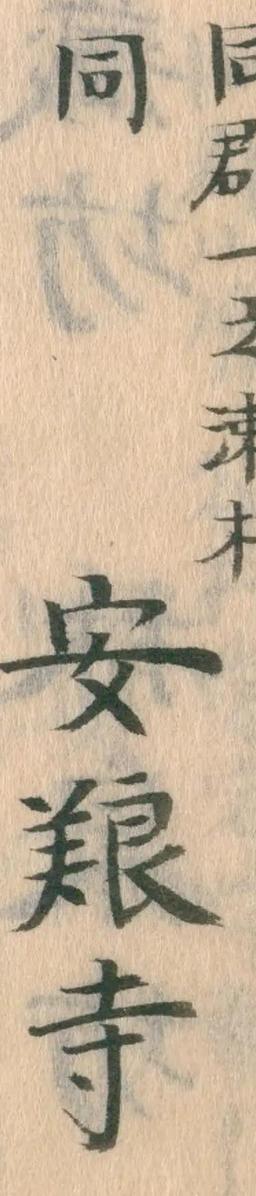同安羪寺
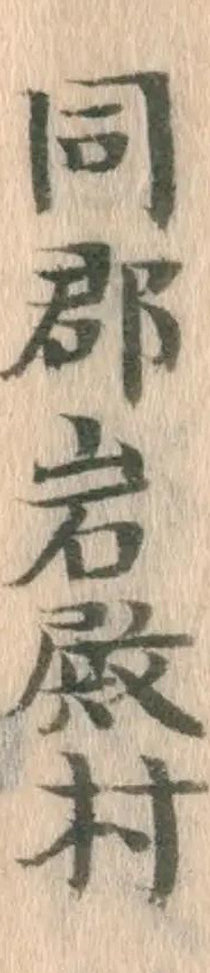同郡岩殿村
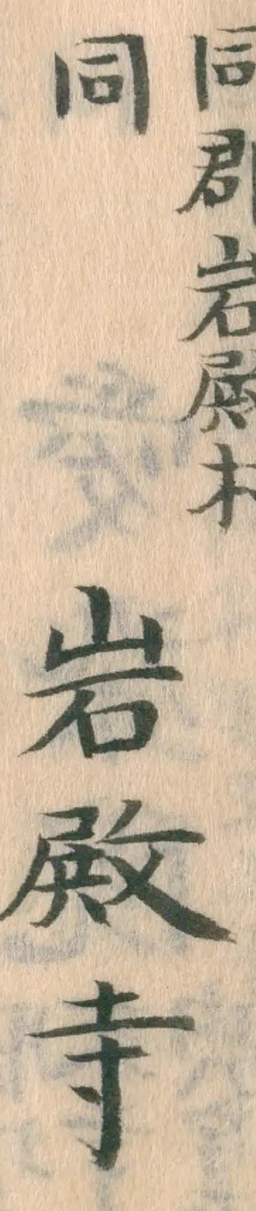同岩殿寺
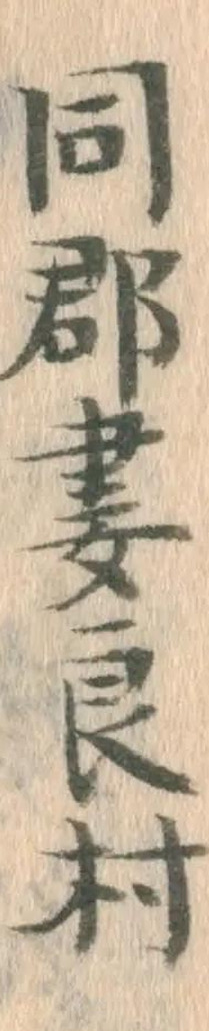同郡妻良村

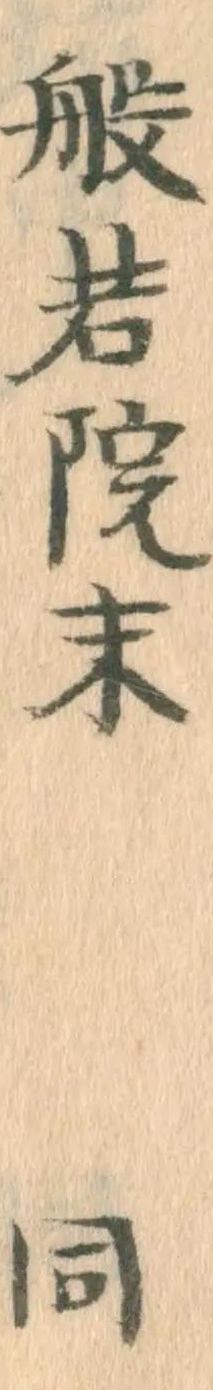般若院未同
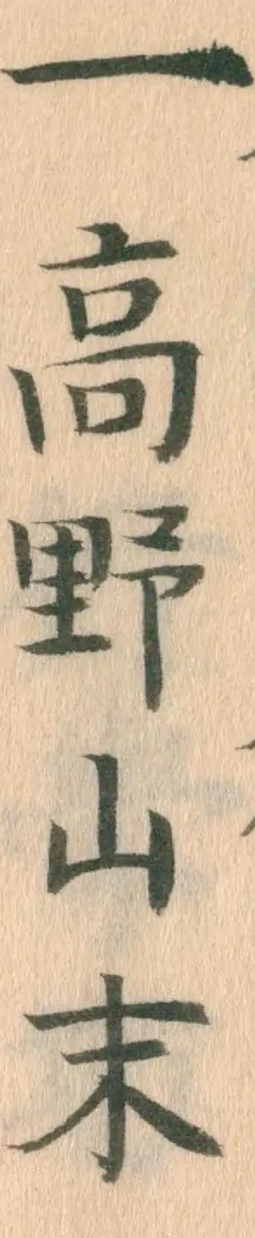一高野山未
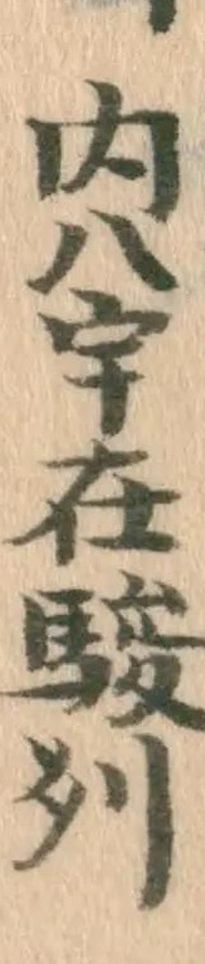内八宇在駿州
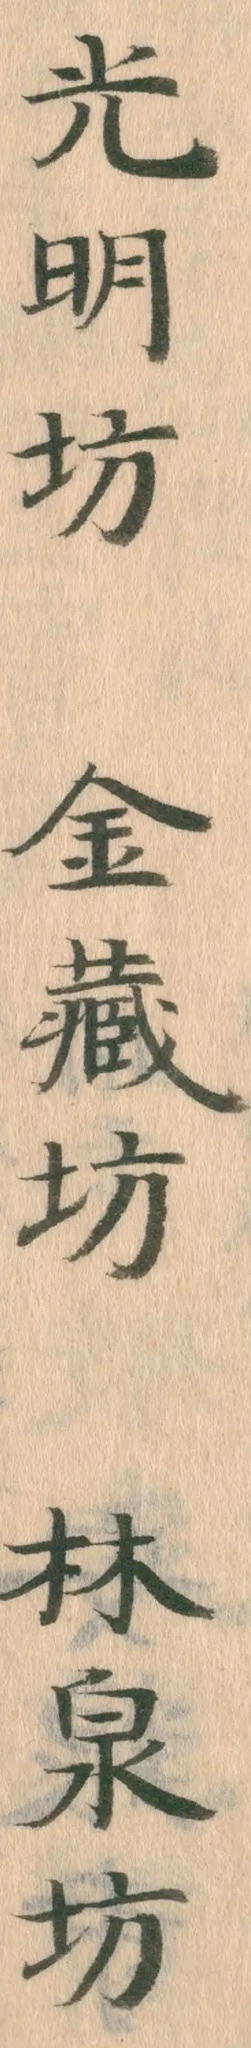光明坊金蔵坊林泉坊
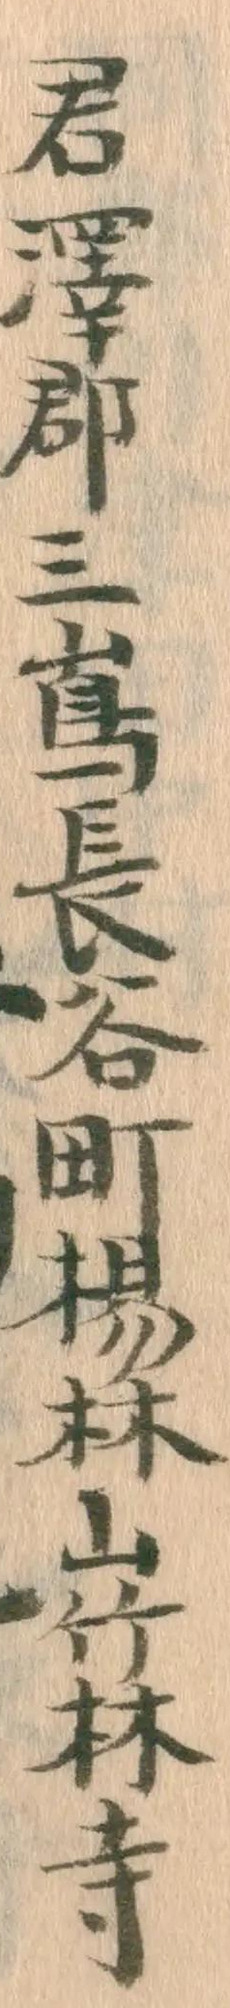君沢郡三嶋長谷町揚林山竹林寺
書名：古義真言宗本末帳 21巻. [4] 第三 伊賀国、伊勢国、志摩国、尾張国、三河国、遠江国、駿河国、伊豆国、甲斐国
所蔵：国立国会図書館 National Diet Library, JAPAN
